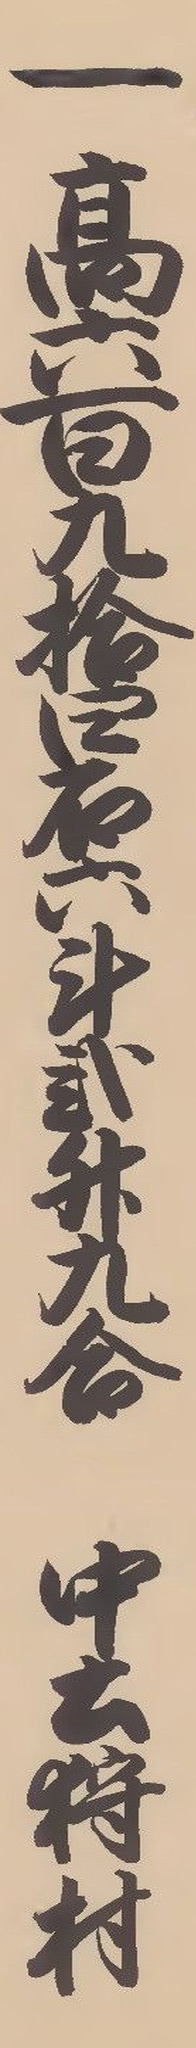一高六百九拾四石六斗弐升九合中土狩村
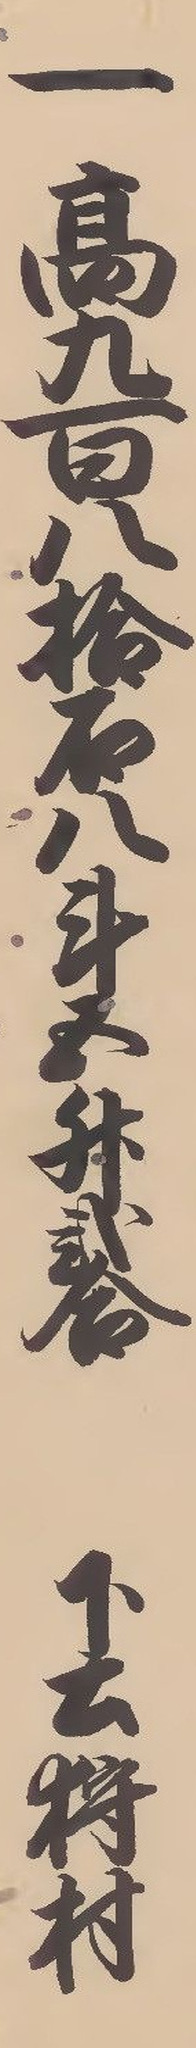一高九百八拾石八斗五升弐合下土狩村

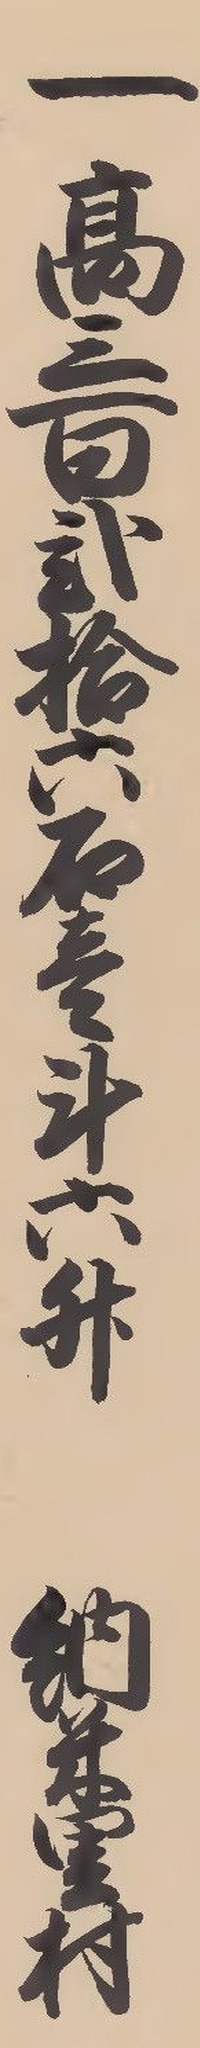一高三百弐拾六石壱斗六升納米里村
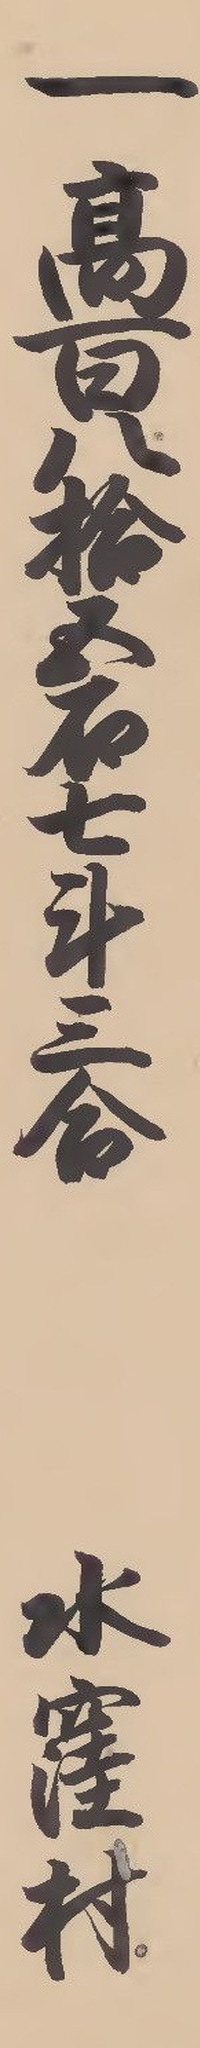一高百八拾五石七斗三合水窪村
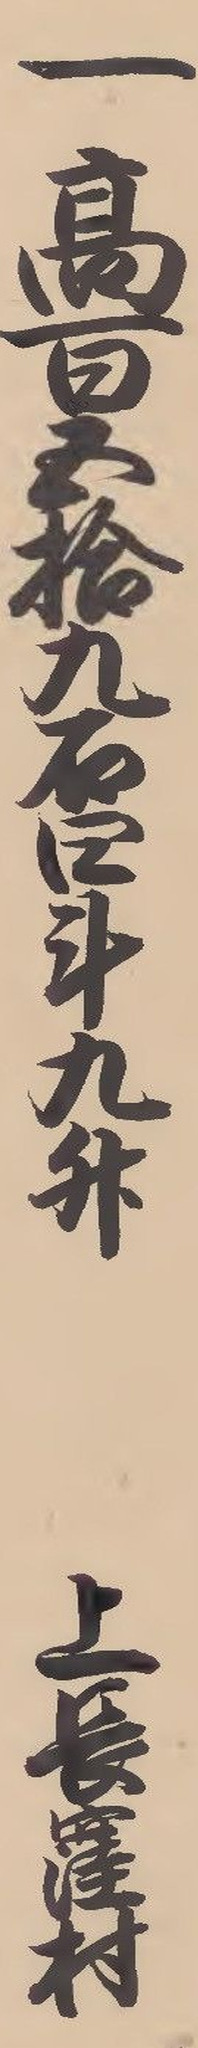一高百五拾九石四斗九升上長窪村
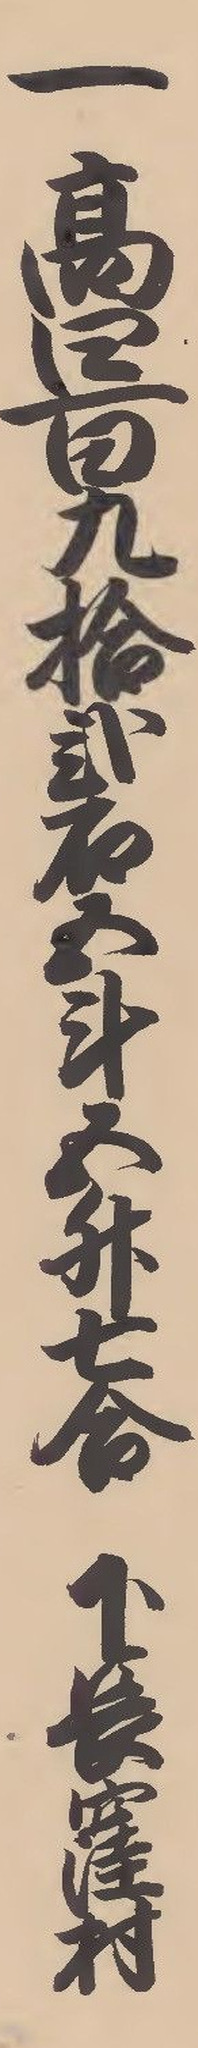一高四百九拾弐石五斗五升七合下長窪村
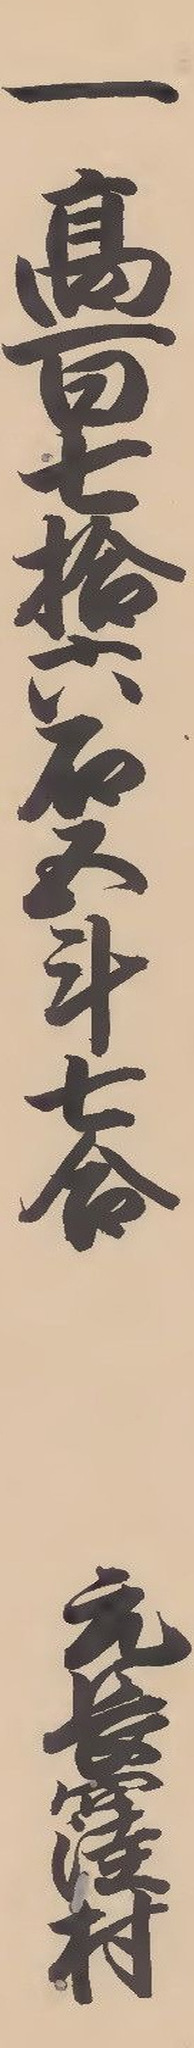一高百七拾六石五斗七合元長窪村
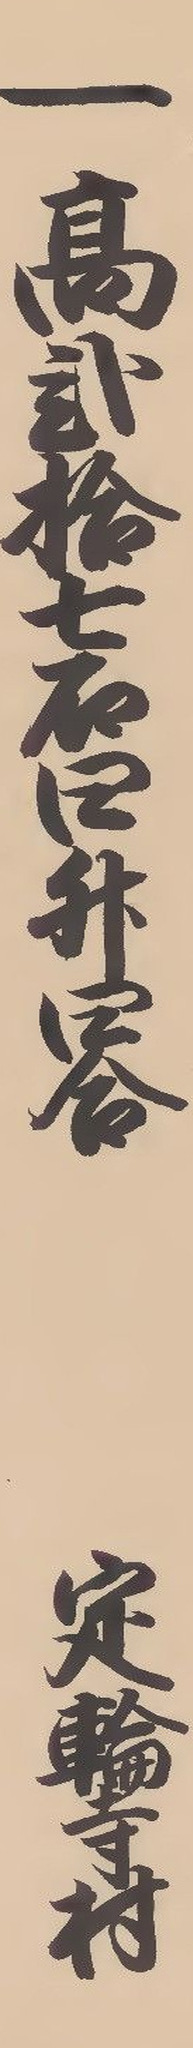一高弐拾七石四升四合定輪寺村
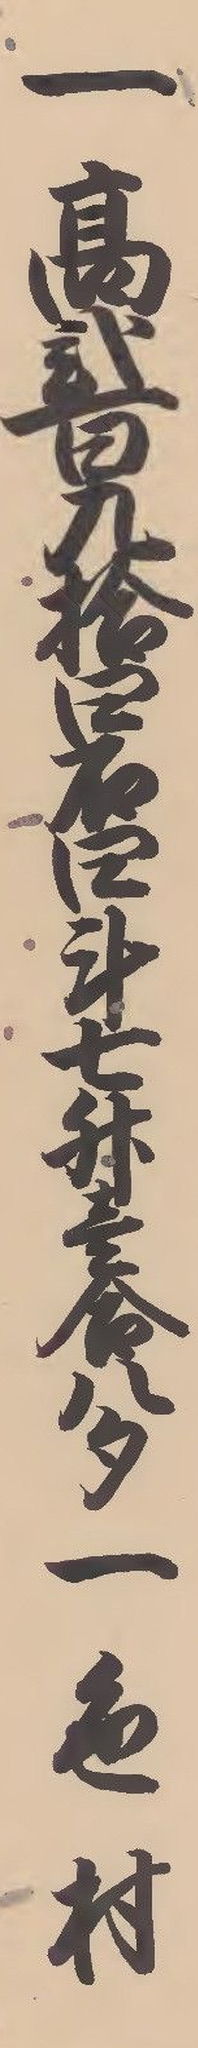一高弐百九拾四石四斗七升壱合八勺一色村

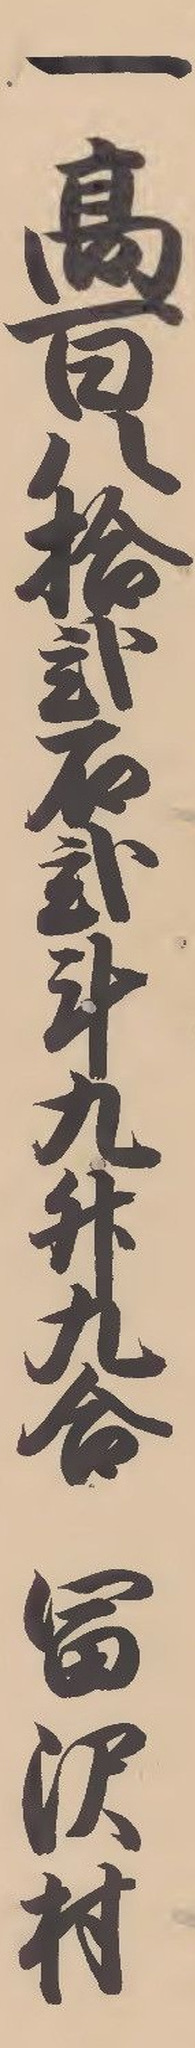一高百八拾弐石弐斗九升九合富沢村
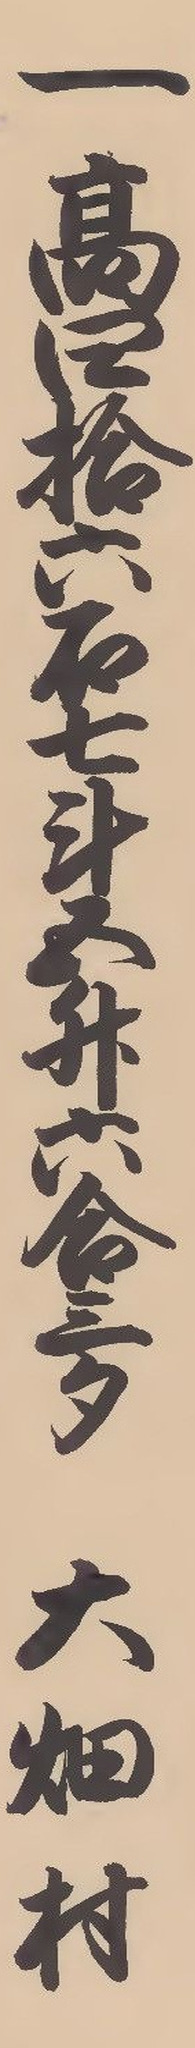一高四拾六石七斗五升六合三勺大畑村
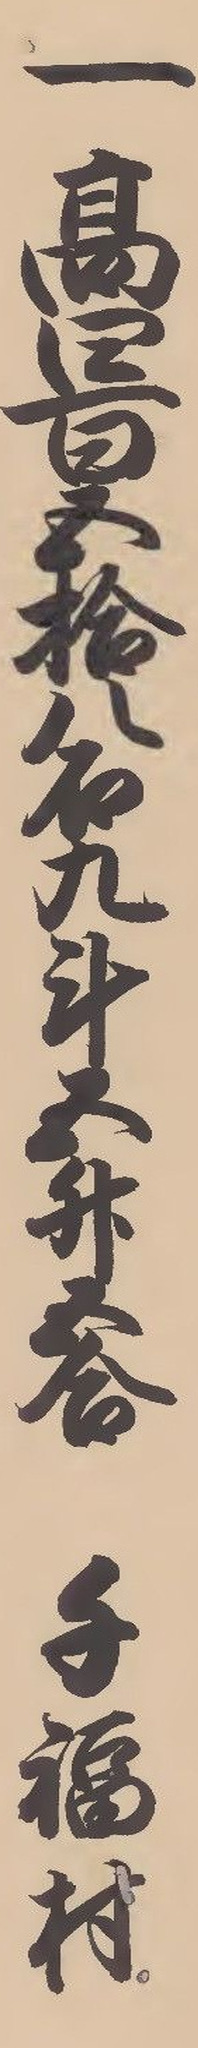一高四百五拾八石九斗五升五合千福村
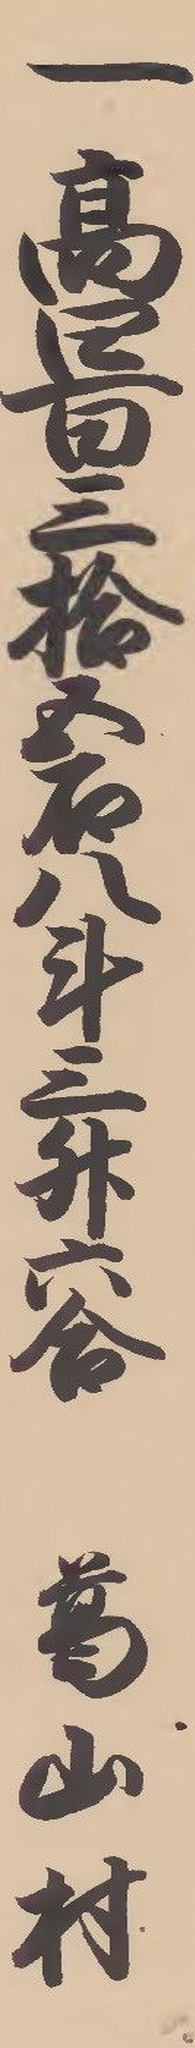一高四百三拾五石八斗三升六合葛山村
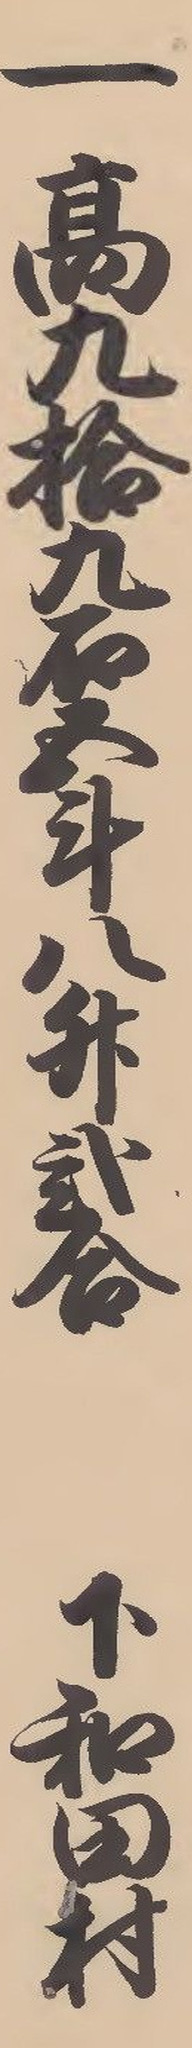一高九拾九石五斗八升弐合下和田村
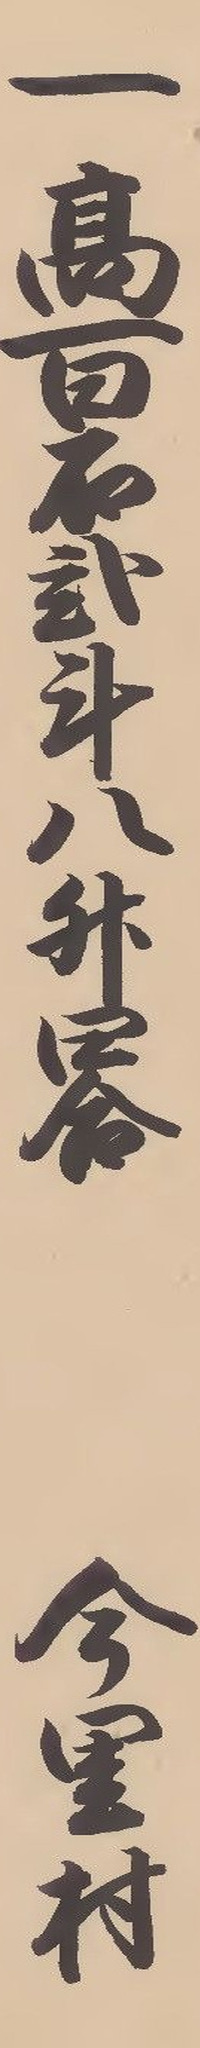一高百石弐斗八升四合今里村
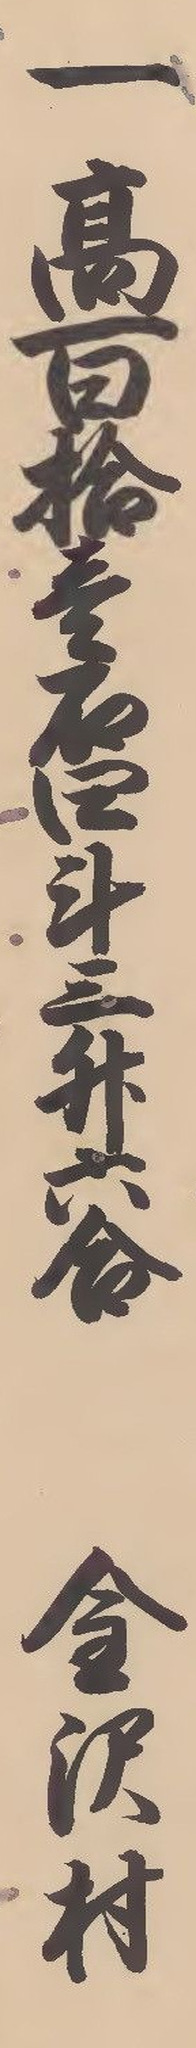一高百拾壱石四斗三升六合金沢村
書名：駿河国郷帳
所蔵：国立公文書館 National Archives of Japan
